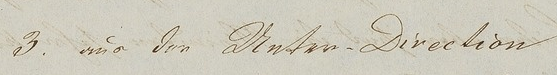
3. aus der Unter-Direction
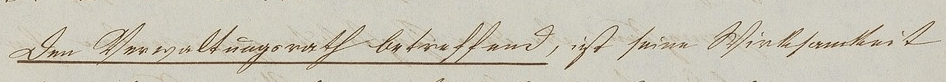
Den Verwaltungsrath betreffend, ist seine Wirksamkeit
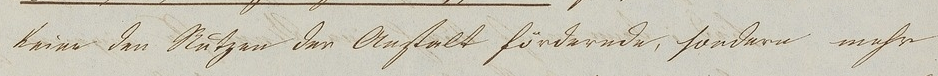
keine den Nutzen der Anstalt fördernde, sondern mehr
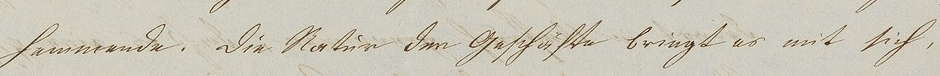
hemmende. Die Natur der Geschäfte bringt es mit sich,
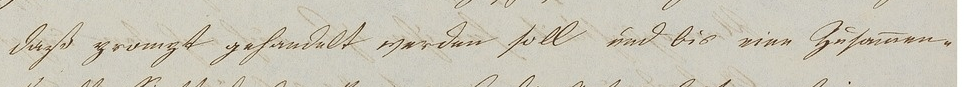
daß prompt gehandelt werden soll und bis eine Zusammen-
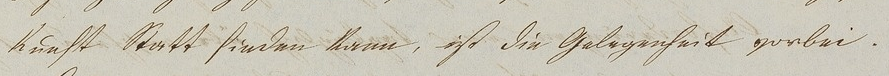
kunft Statt finden kann, ist die Gelegenheit vorbei.
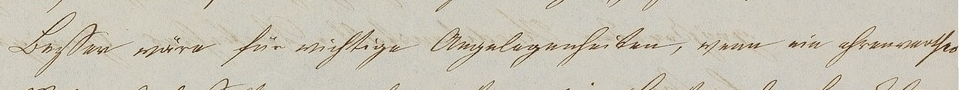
Besser wäre für wichtige Angelgegenheiten, wenn ein ehrenwerthes
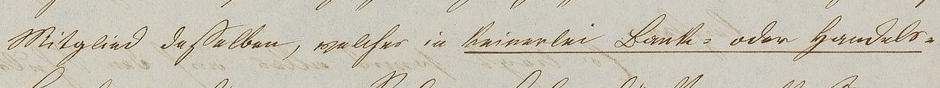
Mitglied desselben, welches in keinerlei Bank- oder Handels--
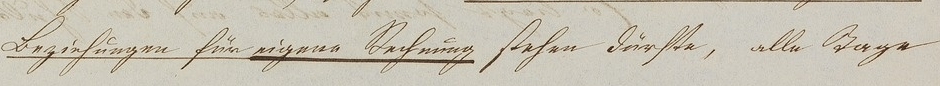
Beziehungen für eigene Rechnung stehen dürfte, alle Tage
